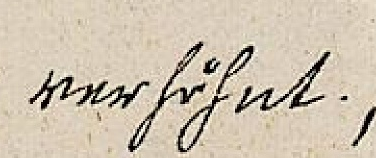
verhöhnt.
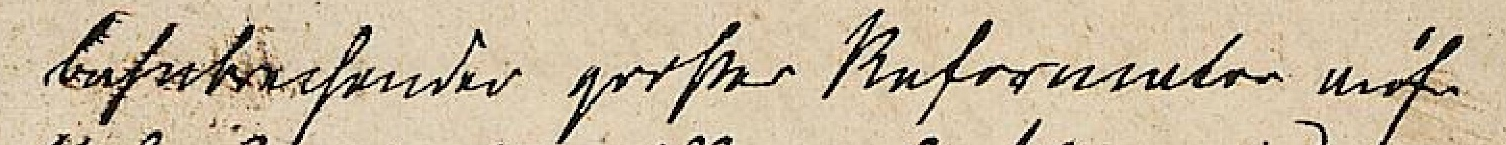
bahnbrechender größter Reformator auf¬
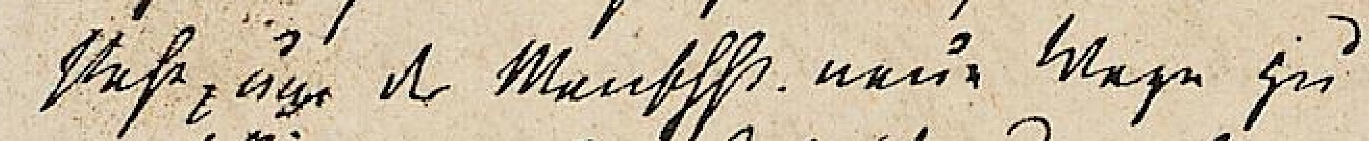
steht, um dr Menschht. neue Wege zu
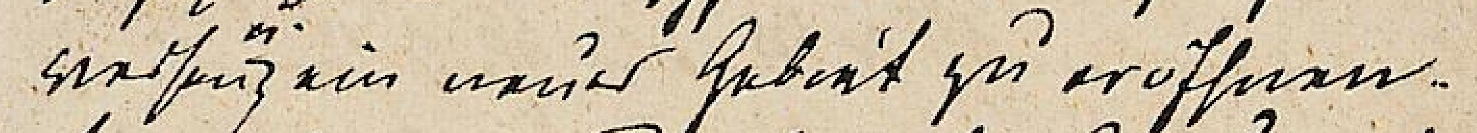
weisen, ein neues Gebiet zu eröffnen
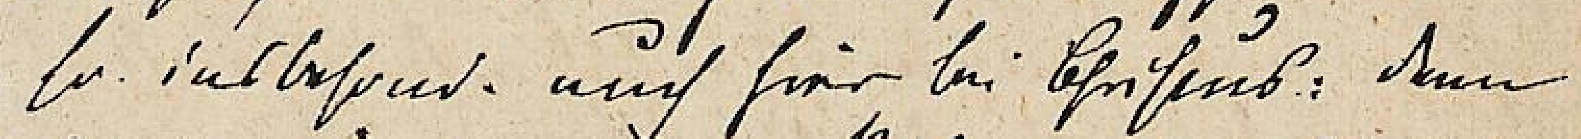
so insbesond. auch hier bei Christus: denn
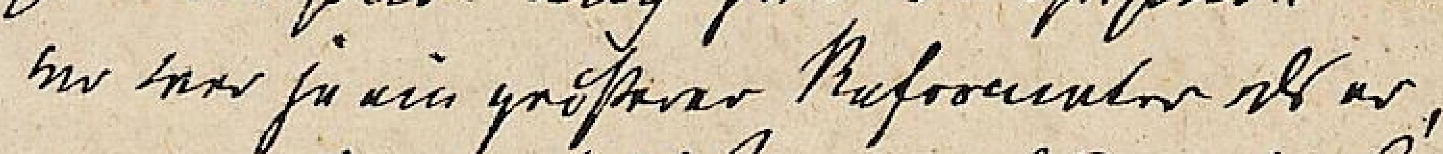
wo war je ein größerer Reformator als er,
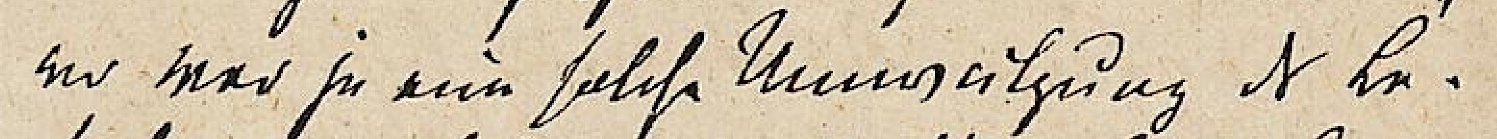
wo war je eine solche Umwälzung ds be¬
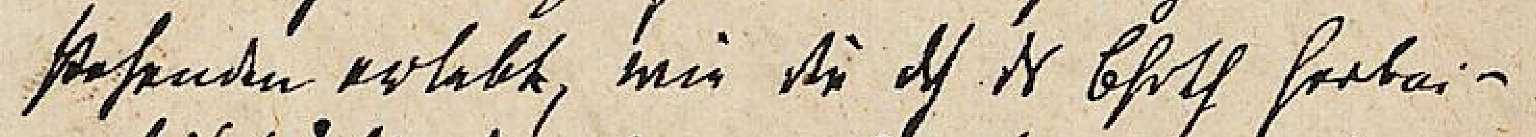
stehenden erlebt, wie die dch ds Chrth herbei¬
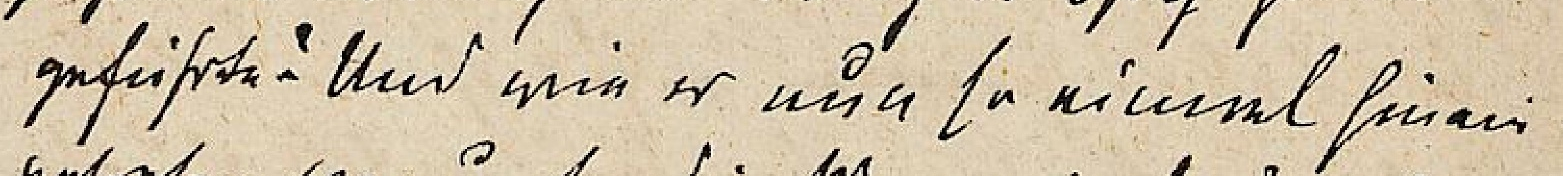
geführte! Und wie er nun so einmal hinein¬
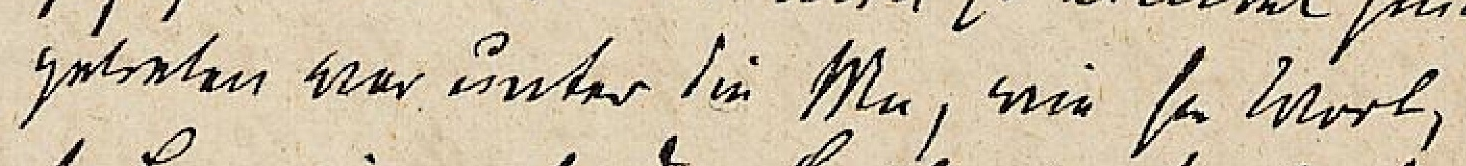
getreten war unter die Mn, wie sn Wort,
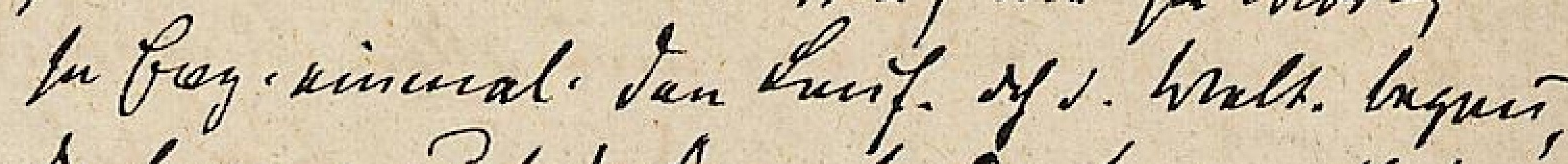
sn Evg. einmal den Lauf dch d. Welt. began,
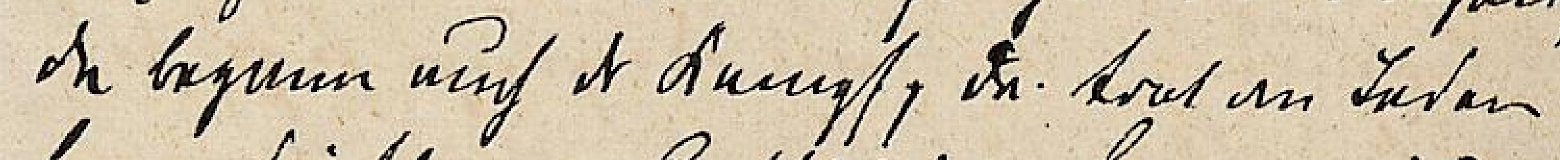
da begann auch dr Kampf, da trat an Jeden
